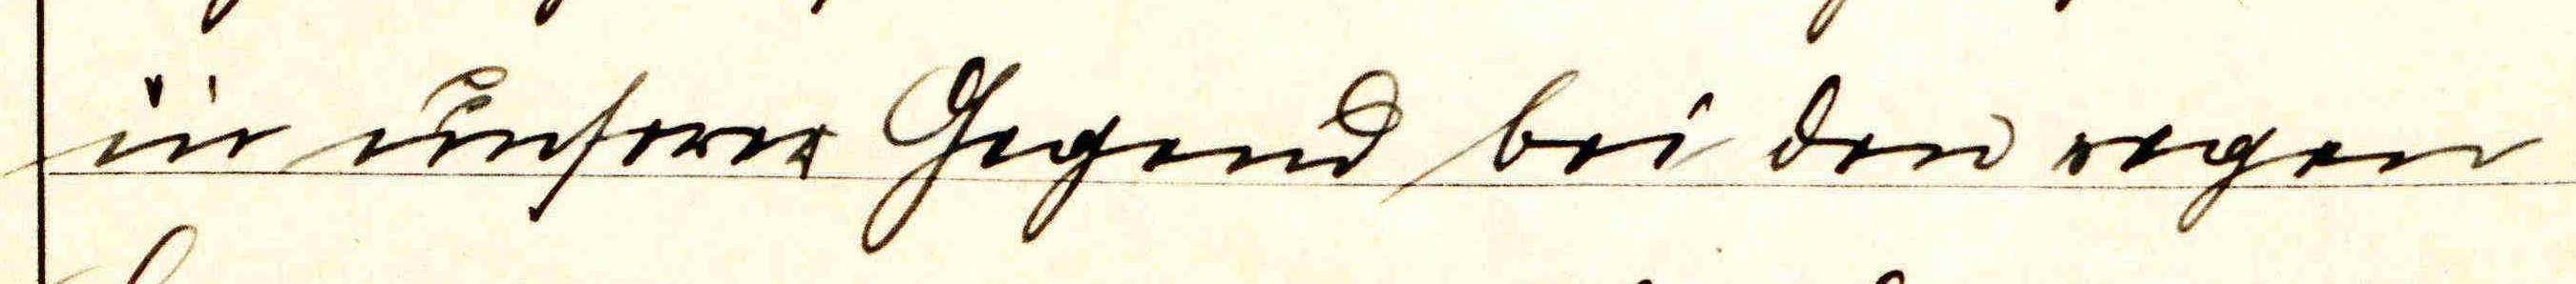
in unserer Gegend bei den regen
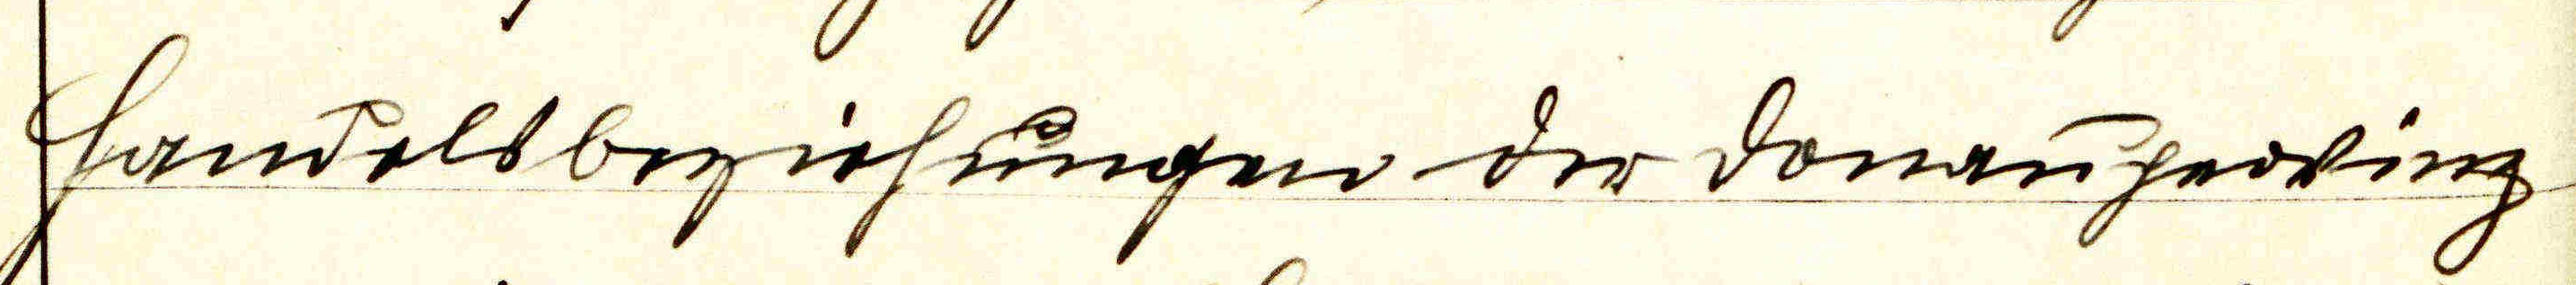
Handelsbeziehungen der Donauprovinz
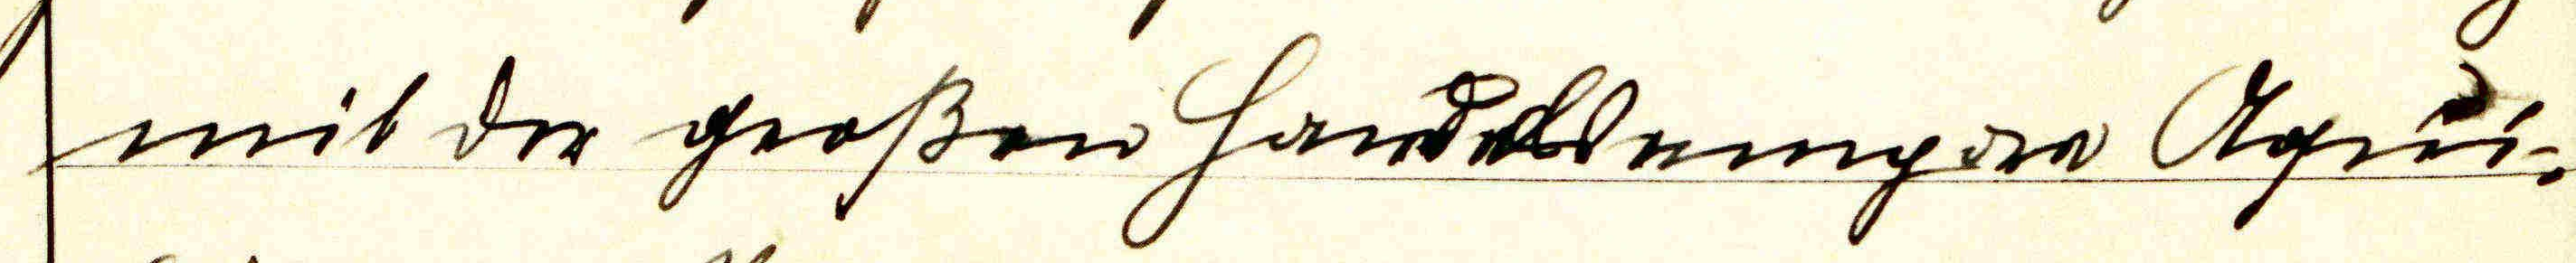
mit der großen Handels??? Aqui-
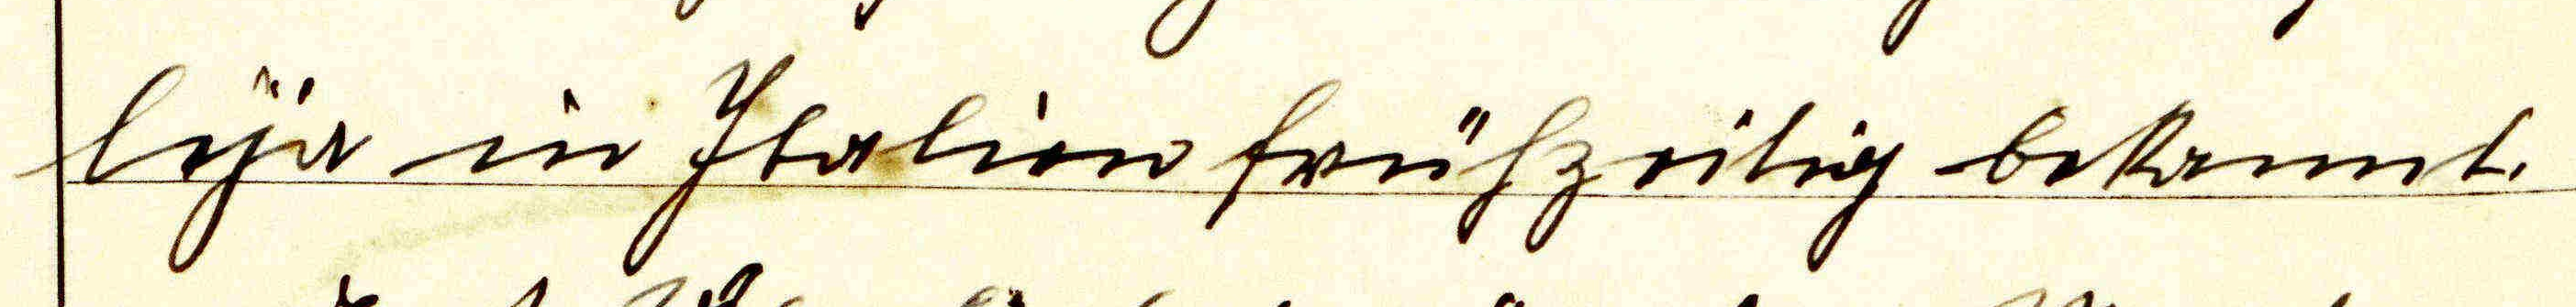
lya in Italien frühzeitig bekannt.
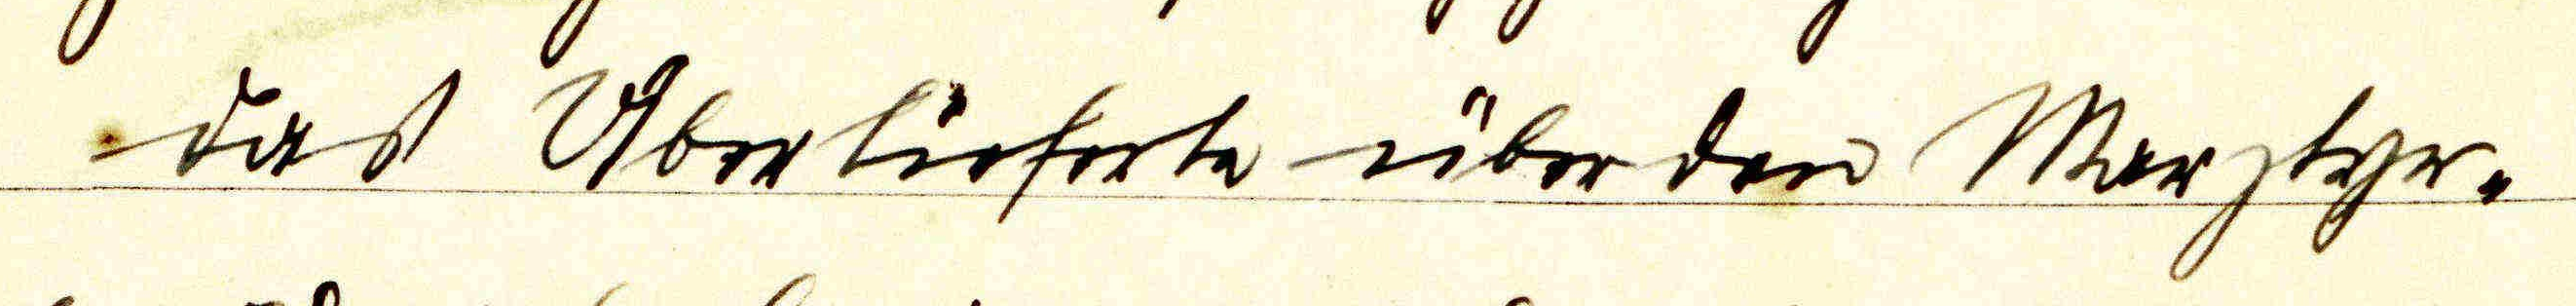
Das Überlieferte über den Maytyr-
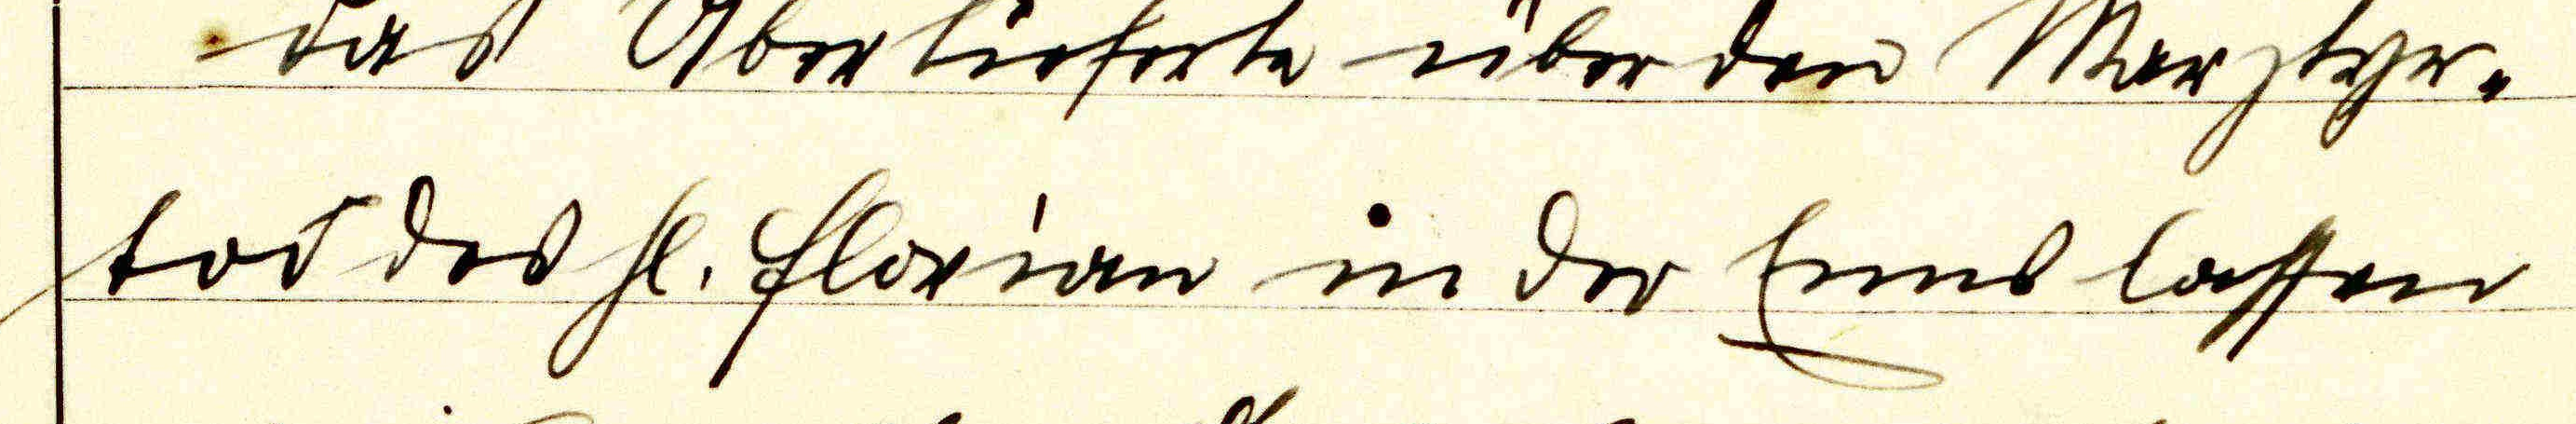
tod des Hl. Florian in der Enns lassen
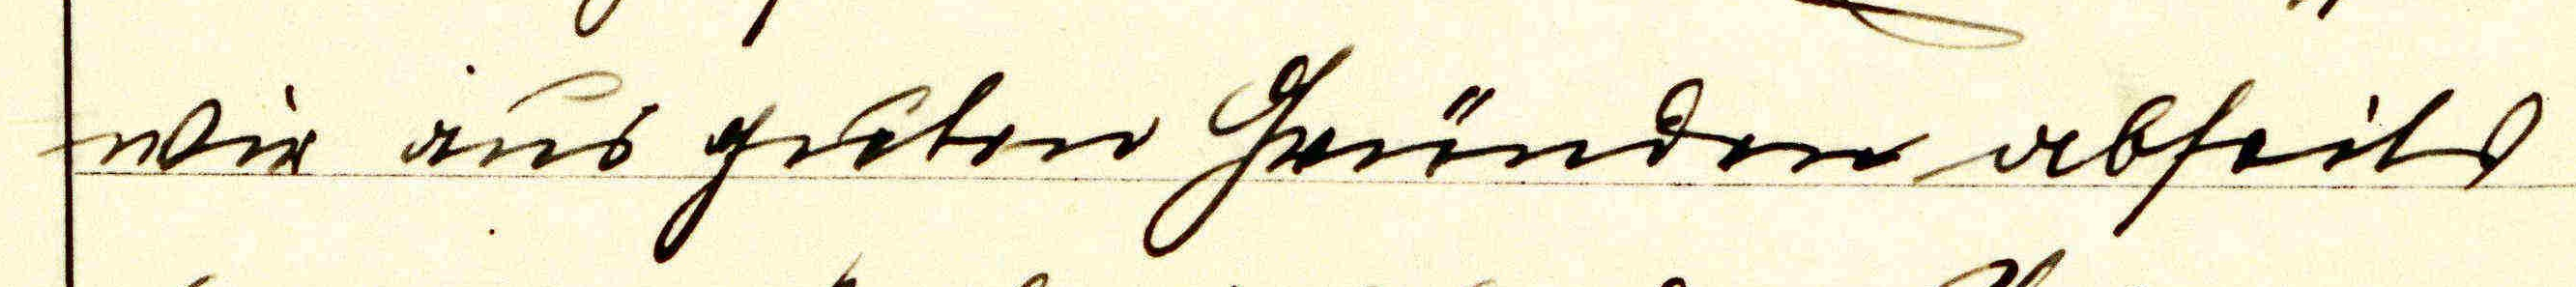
wir aus gutem Gründen abseits
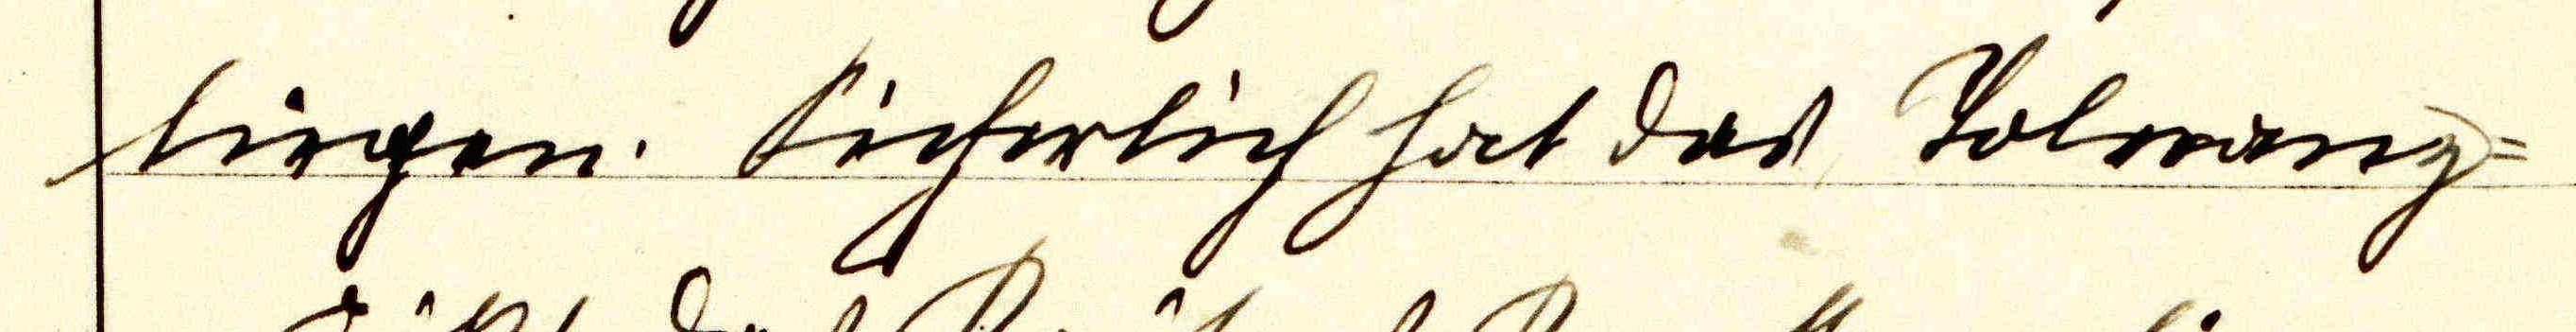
liegen. Kirchlich hat das Toleranz-
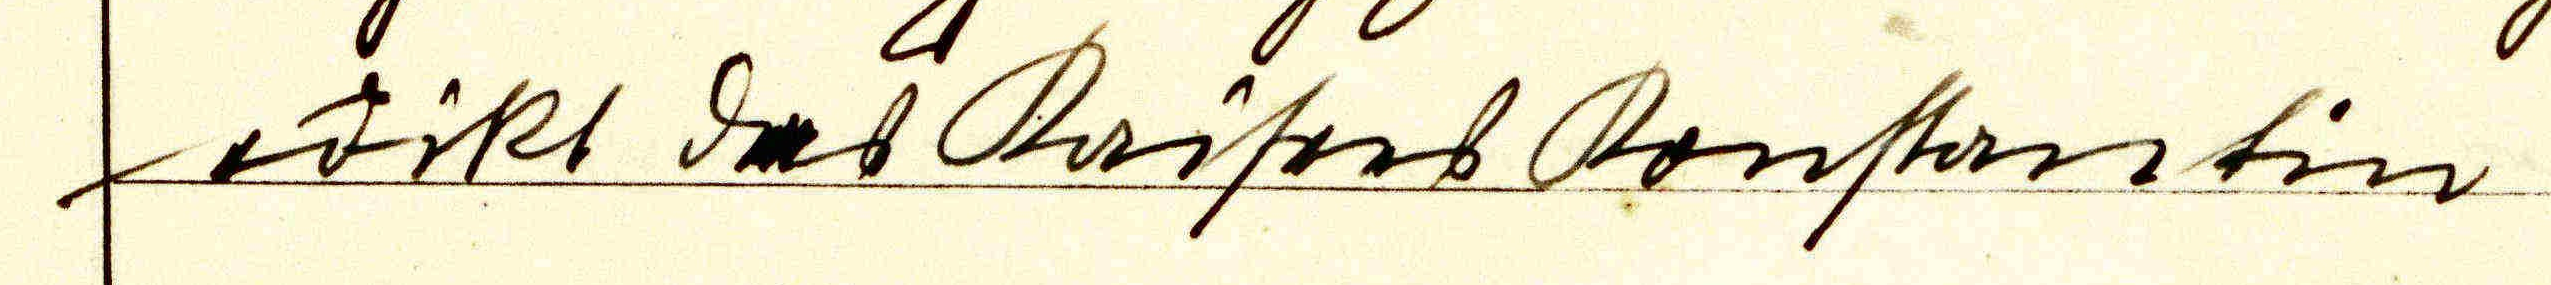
edikt des Kaisers Konstantin
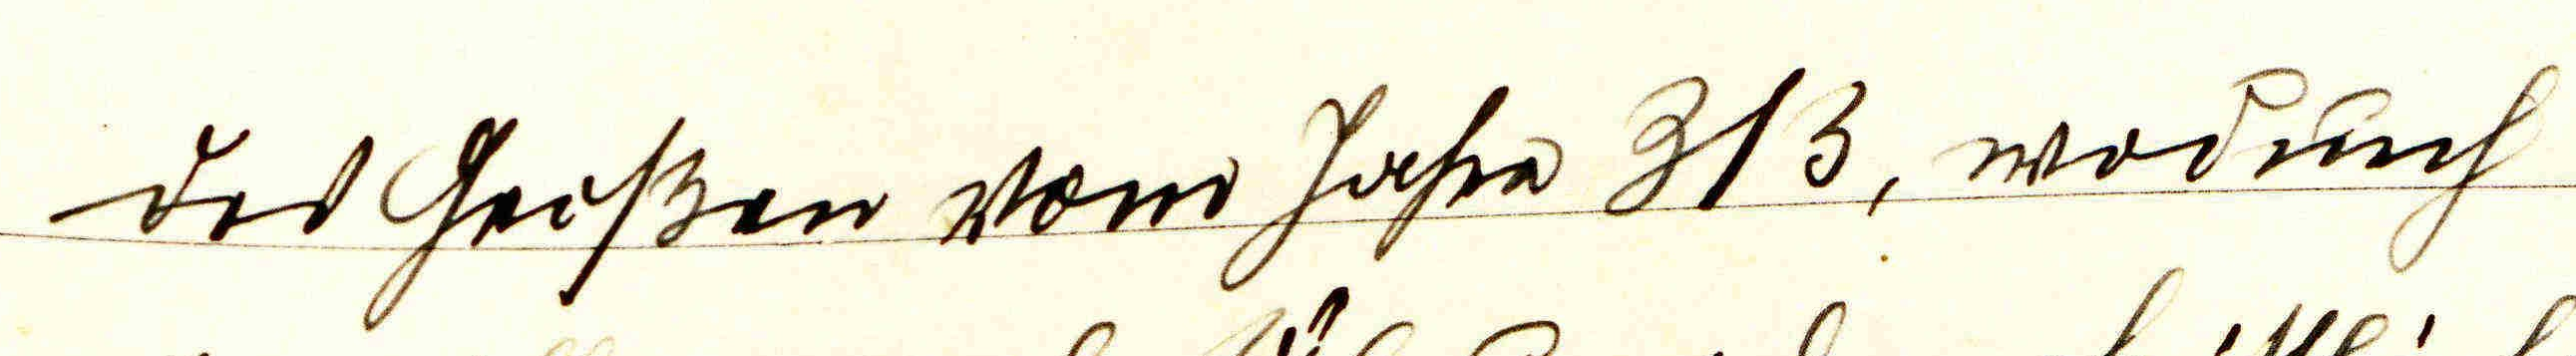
des Großen vom Jahre 313, wodurch
